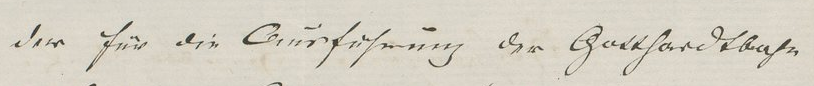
der für die Ausführung der Gotthardtbahn
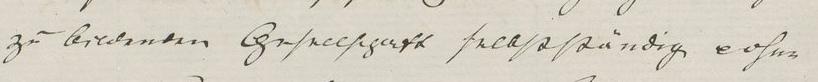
zu bildenden Gesellschaft selbstständig & ohne
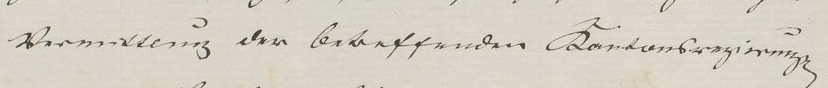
Vermittlung der betreffenden Kantonsregierungen
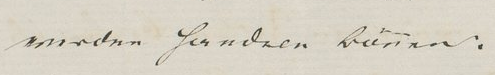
werden handeln können.
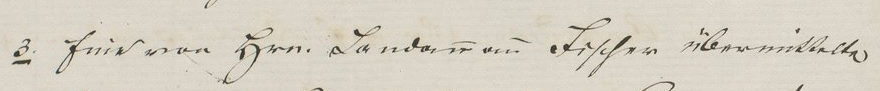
3. Eine von Hrn. Landammann Fischer übermittelte
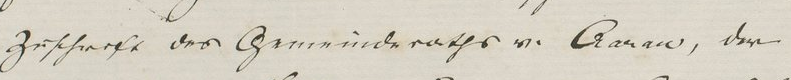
Zuschrift des Gemeinderathes v. Aarau, der
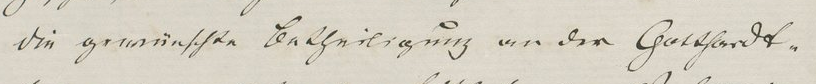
die gewünschte Betheiligung von der Gotthardt -
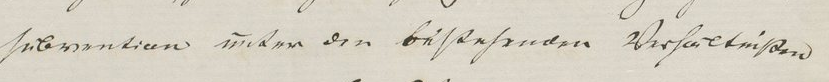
subvention unter den bestehenden Verhältnißen
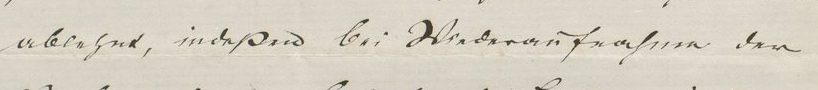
ablehnt, indeßen bei Wiederaufnahme der
